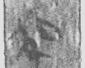六
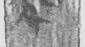十
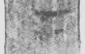二
